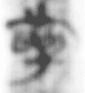革
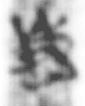兼
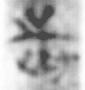齒
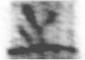之
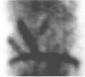之
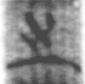之
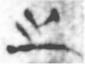之
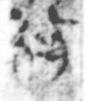紫
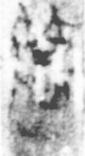○（席）
